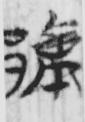郙
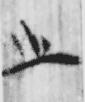之
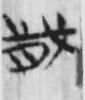歲（歲）
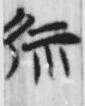𫵖
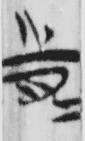之月
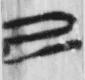己
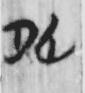卯
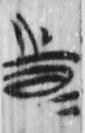之日
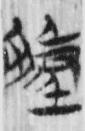○（陳）
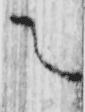乙
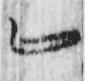㠯（以）
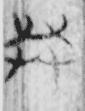共
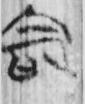命
